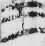王
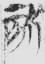所
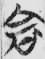舍
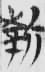新
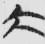大
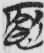○（厩）
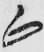㠯（以）
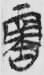啻
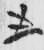之
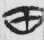田
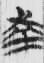南
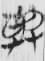與
